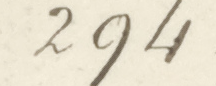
294.
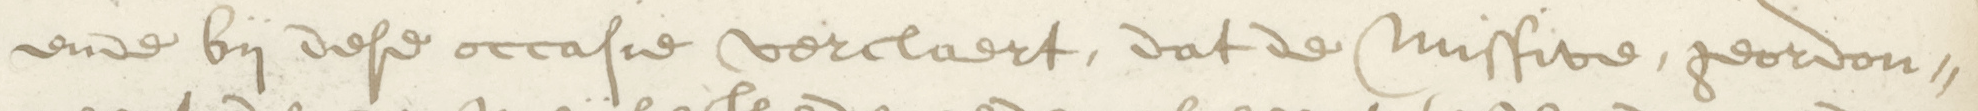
ende bij dese occasie verclaert, dat de Missive, geordon„
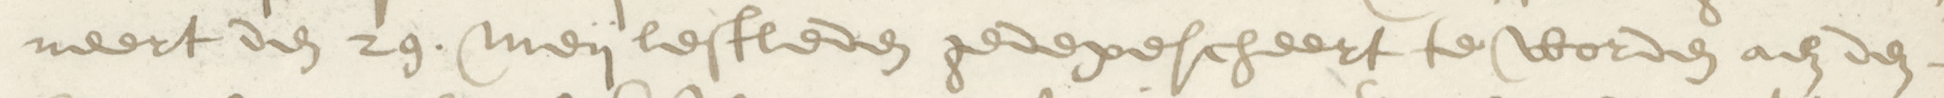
neert den 29. meij lestleden gedepescheert te worden aen den —
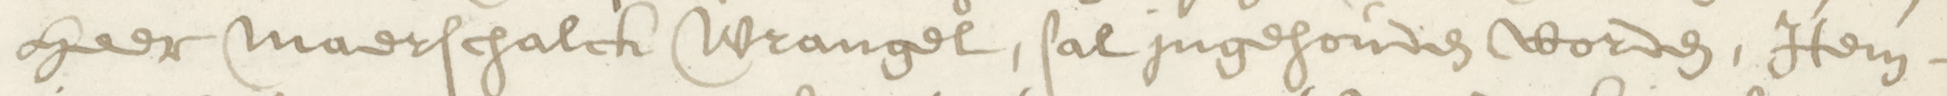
heer maerschalck Wrangel, sal ingehouden worden. Item —
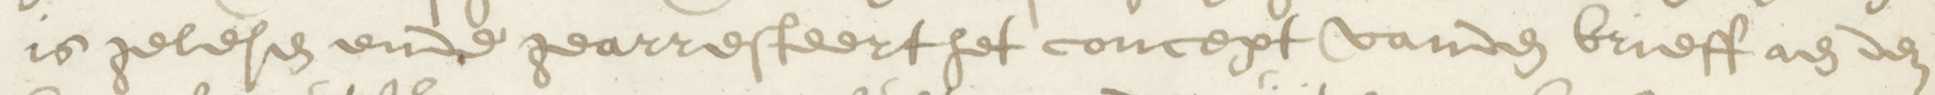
is gelesen ende gearresteert het concept vanden brieff aen den
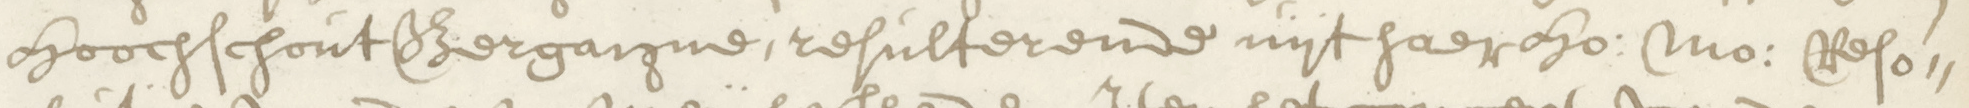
hoochschout Bergaigne, resulterende uijt haer Ho:Mo: Reso„
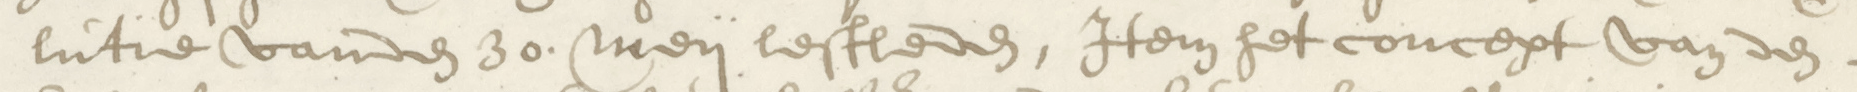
lutie vanden 30. meij lestleden, Item het concept van den —
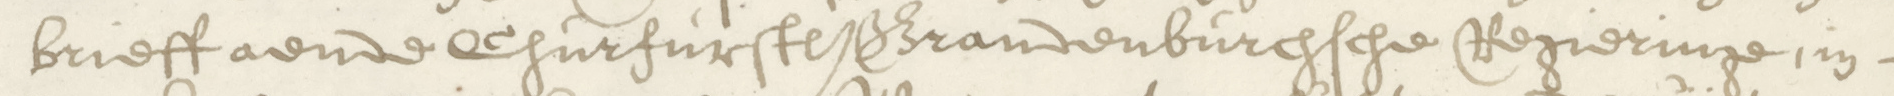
brieff aende Churfurstl Brandenburchsche Regieringe, in —
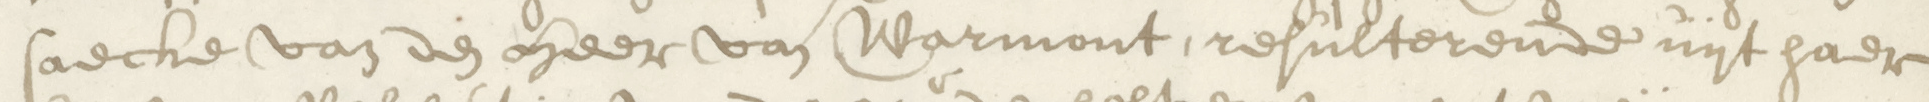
saecke van den heer van Warmont, resulterende uijt haer
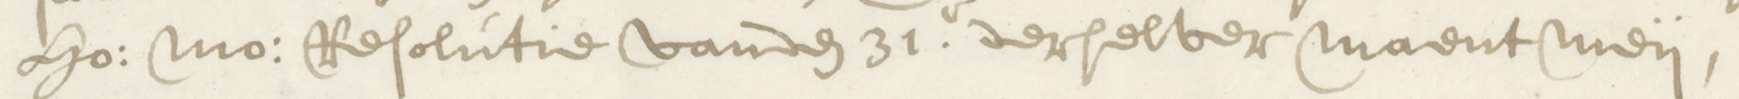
Ho:Mo: Resolutie vanden 31e. derselver maent meij.
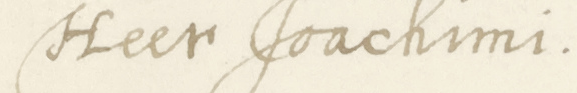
Heer Joachimi.
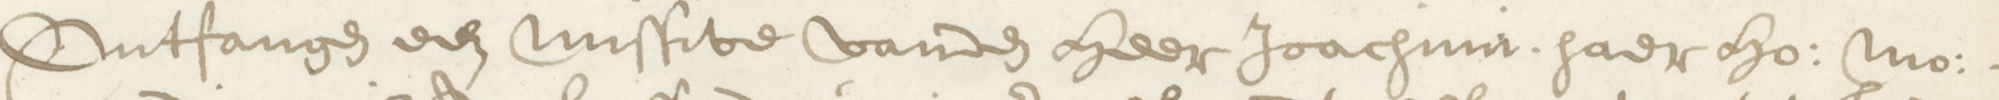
Ontfangen een missive vanden heer Joachimi, haer Ho:Mo: —
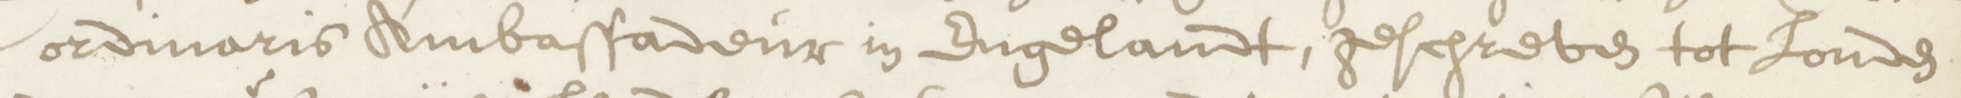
ordinaris Ambassadeur in Engelandt, geschreven tot Londen —
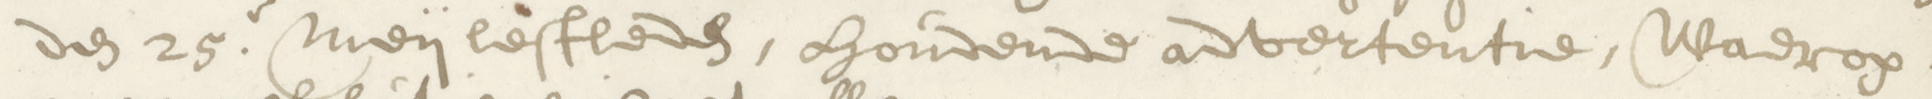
den 25e meij lestleden, houdende advertentie, Waerop —
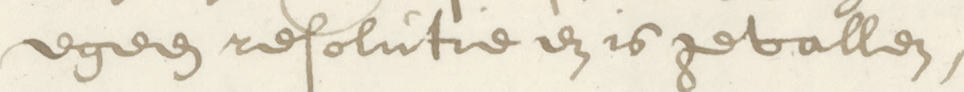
egeen resolutie en is gevallen.
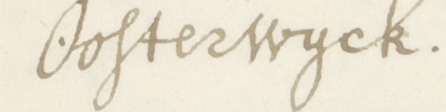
Oosterwijck.
